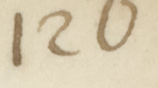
126
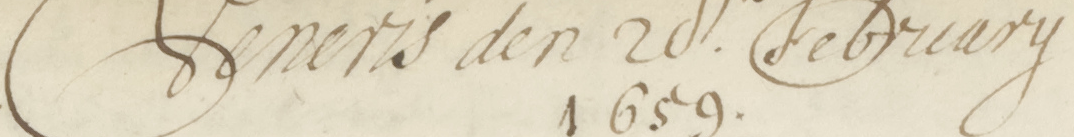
Veneris den 28en. February
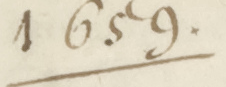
1659.
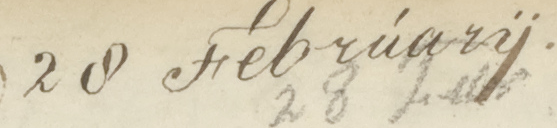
28 Februarij.
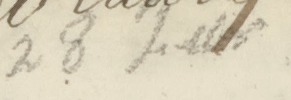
28 Febr.
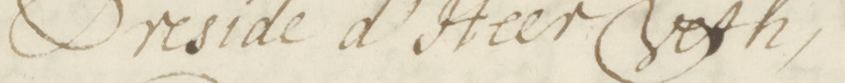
Preside d'Heer Veth,
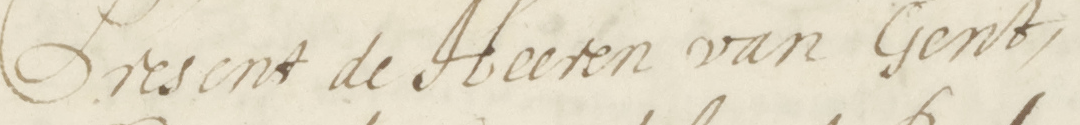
Present de Heeren van Gent,
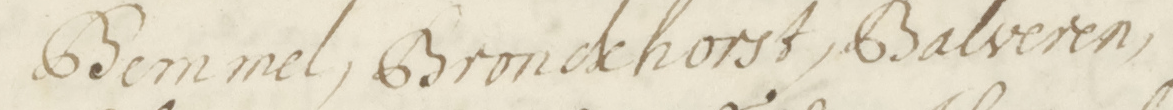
Bemmel, Bronckhorst, Balveren,
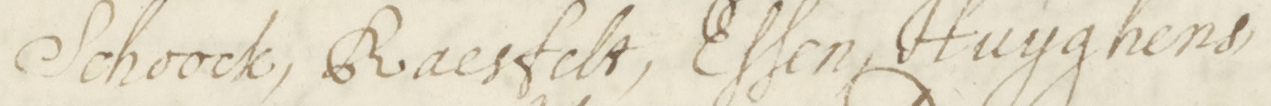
Schoock, Raesfelt, Essen, Huyghens
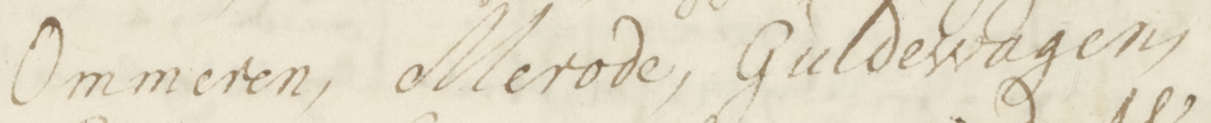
Ommeren, Merode, Guldewagen,
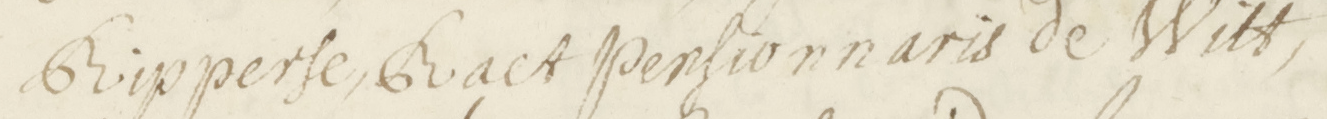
Ripperse, Raetpensionnaris de Witt
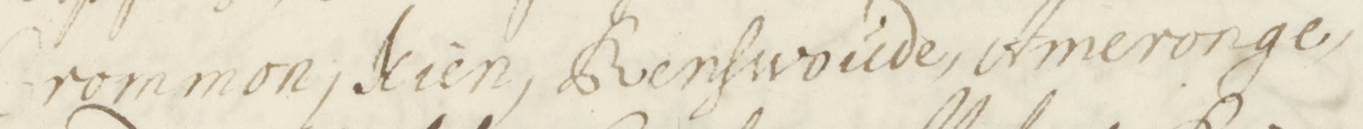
Crommon, Kien, Renswoude, Ameronge,
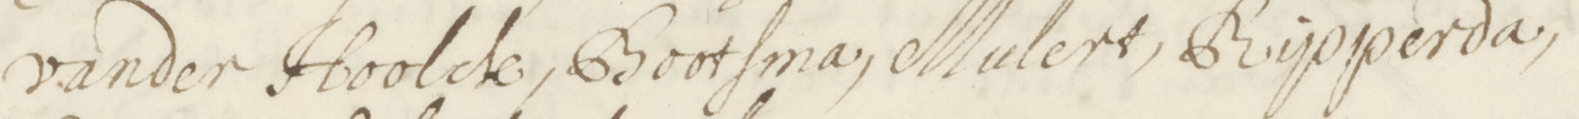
vander Hoolck, Bootsma, Mulert, Rippperda,
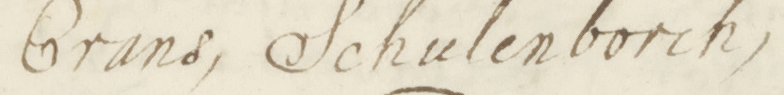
Crans, Schulenborch,
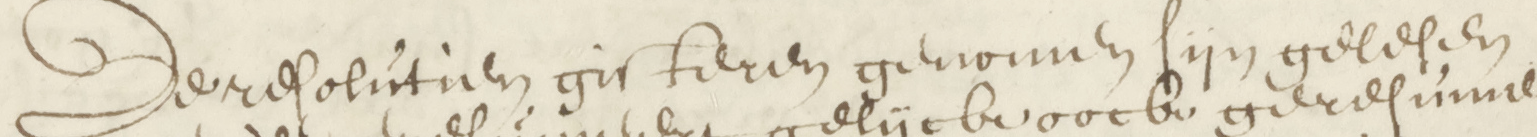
De resolutien gisteren genomen sijn gelesen
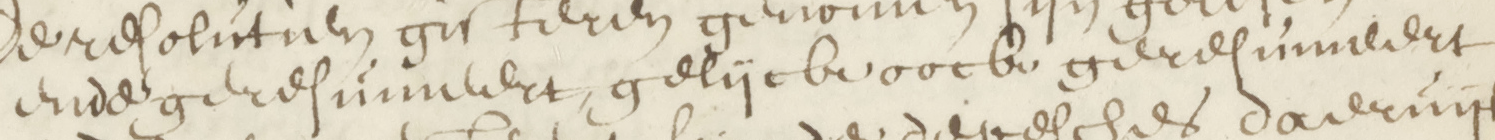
ende geresumeert, gelijck oock geresumeert
